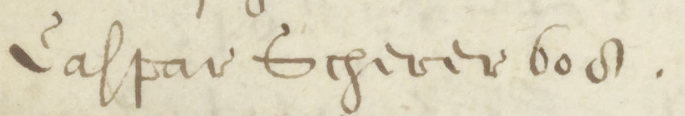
Caspar Scherer 608.
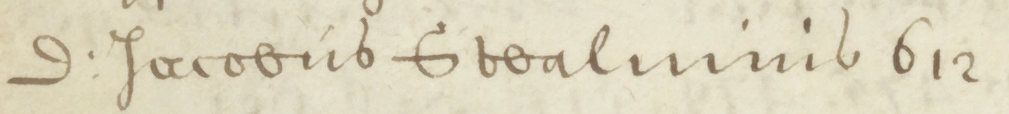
D: Jacobus Swalmius 612
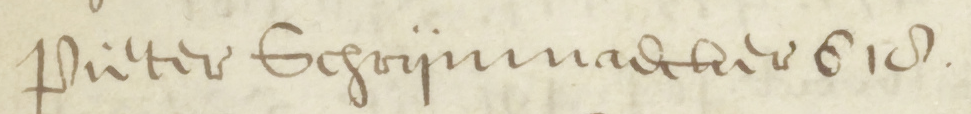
Pieter Schrijnmaecker 618.
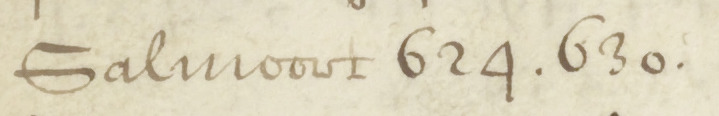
Salmoort 624. 630.
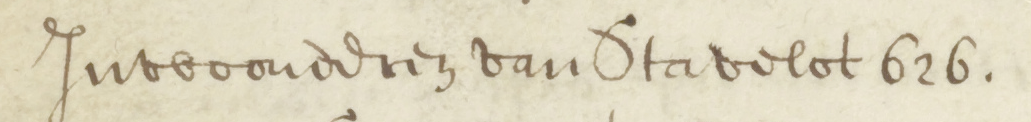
Inwoonderen van Stavelot 626.
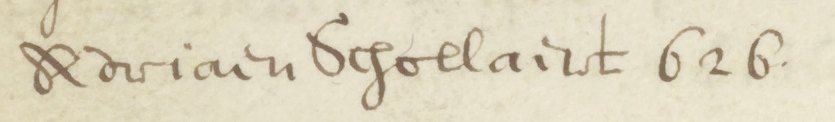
Adriaen Schollaert 626.
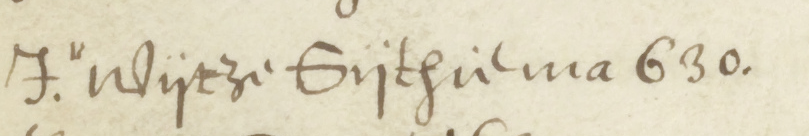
Jr. Wijtze Sijthiema 630.
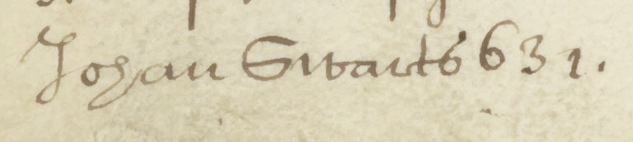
Johan Swarts 631.
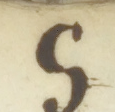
S
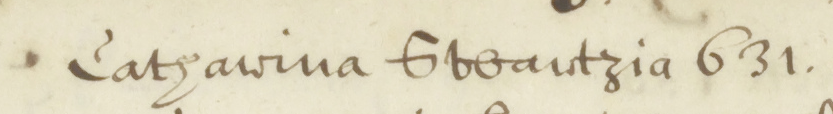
Catharina Swartzia 631.
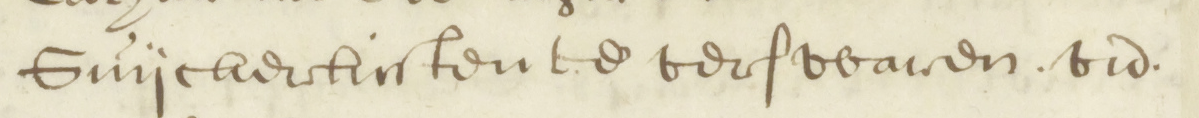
Suijckerkisten te verswaren vid.
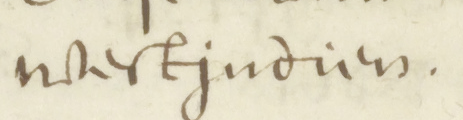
Westindien.
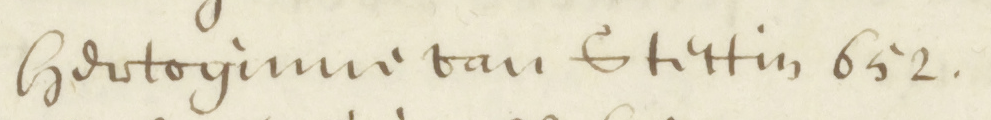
hertoginne van Stettin 652.
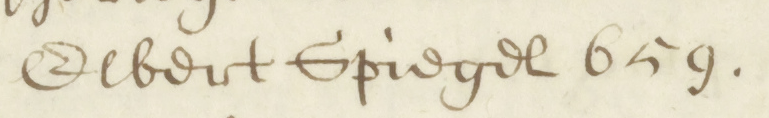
Elbert Spiegel 659.
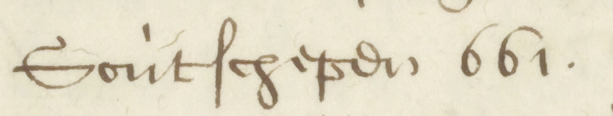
Soutschepen 661.
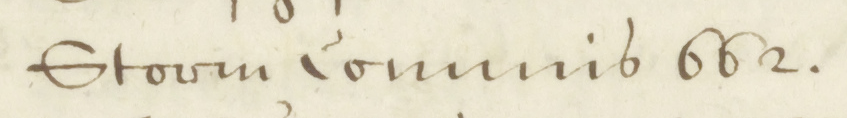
Storm Commis 662.
